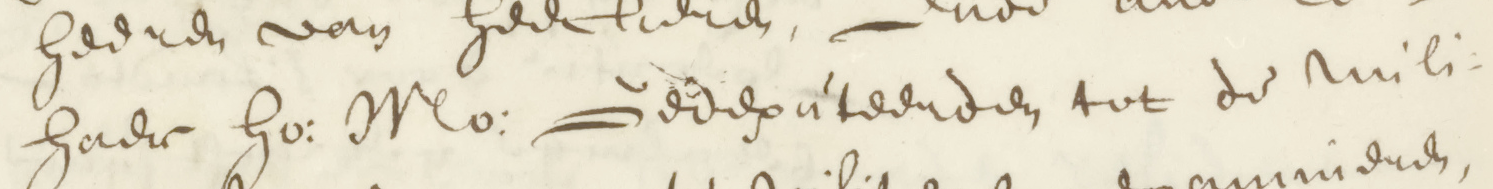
haer ho:Mo: Gedeputeerden tot de mili„
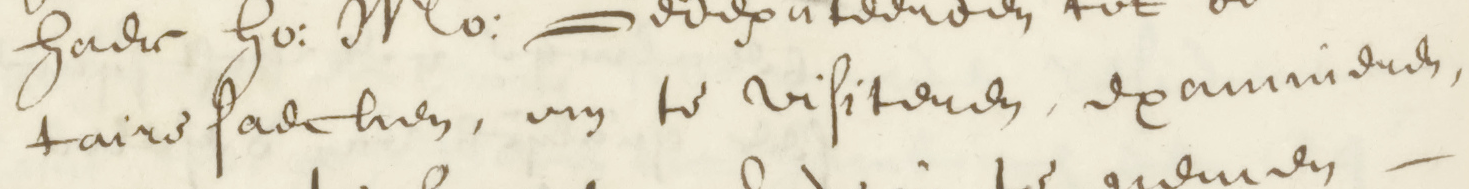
taire saecken, om te visiteren, examineren,
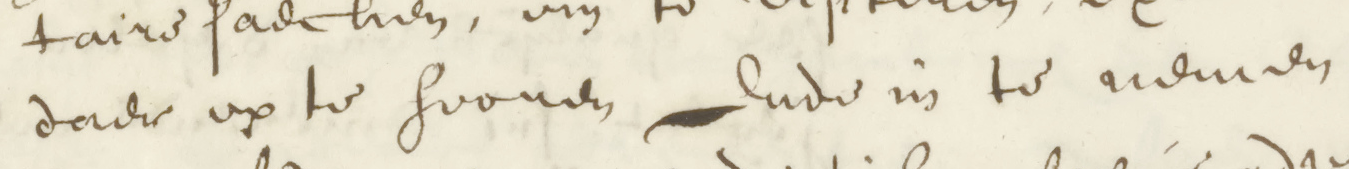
daer op te hooren Ende in te nemen
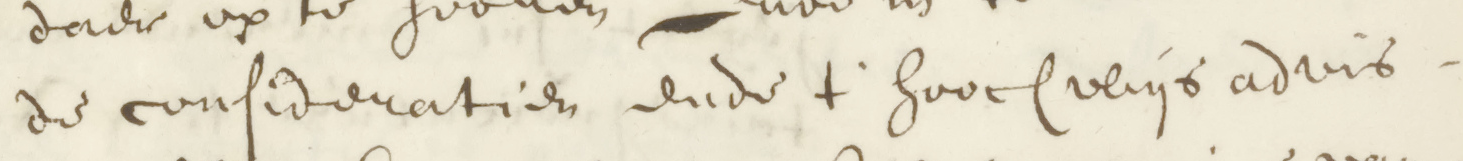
de consideratien ende t' hoochwijs advis
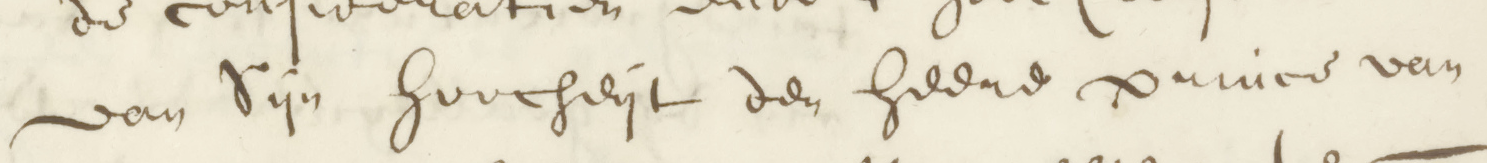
van Sijn hoocheijt den heere prince van
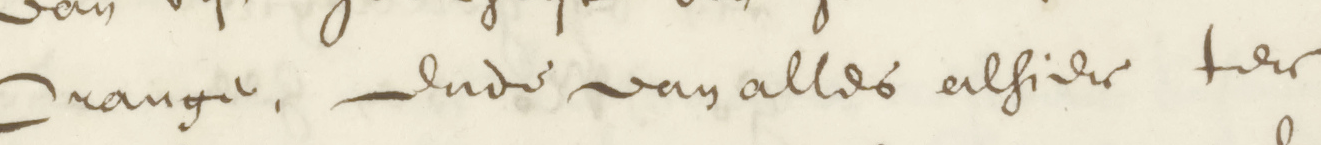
Orange, Ende van alles alhier ter
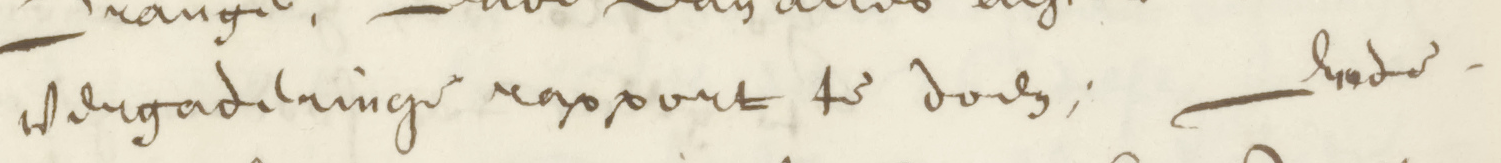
Vergaderinge rapport te doen; Ende
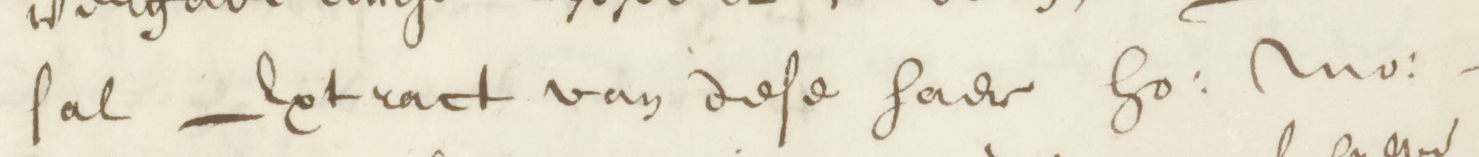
sal Extract van dese haer ho:Mo:
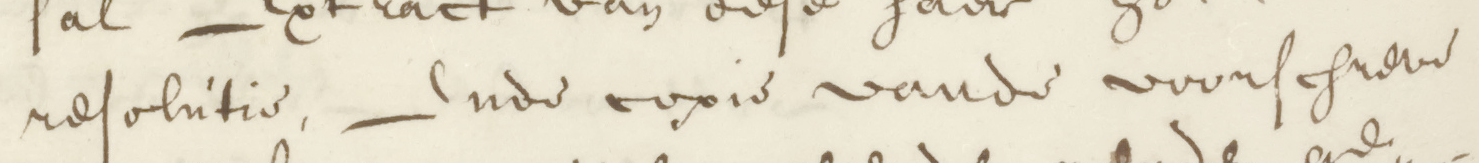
resolutie, Ende copie vande voorschreve
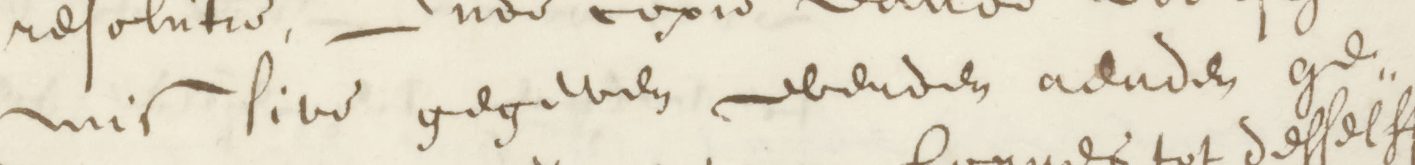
missive gegeven werden aenden ge„
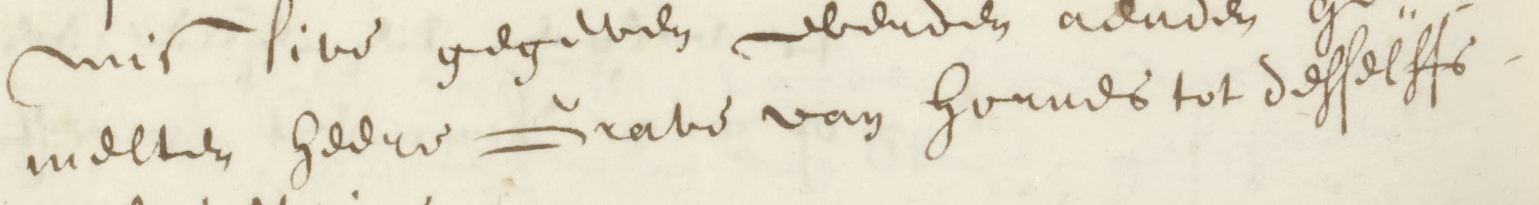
melten heere Grave van Hornes tot desselffs
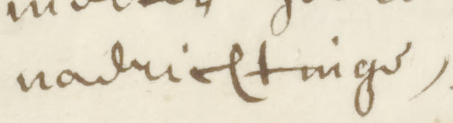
naerichtinge.
